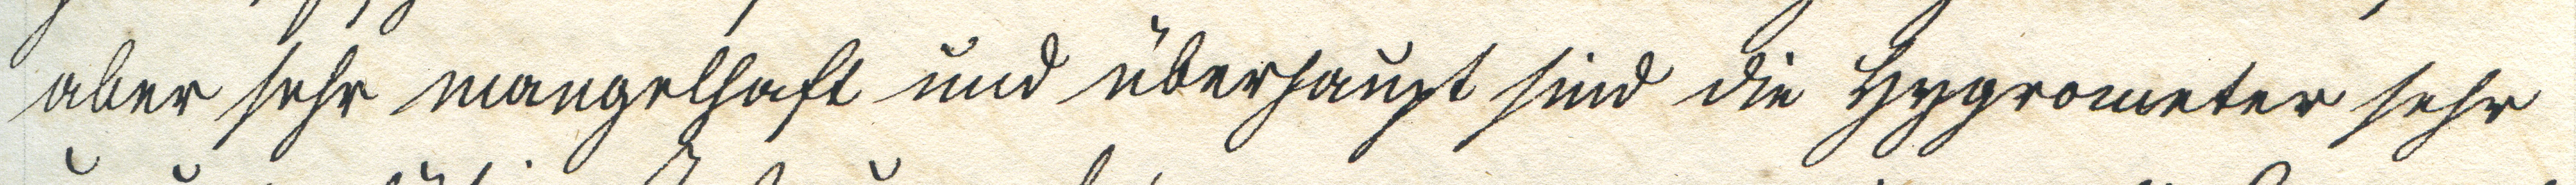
aber sehr mangelhaft und überhaupt sind die Hygrometer sehr
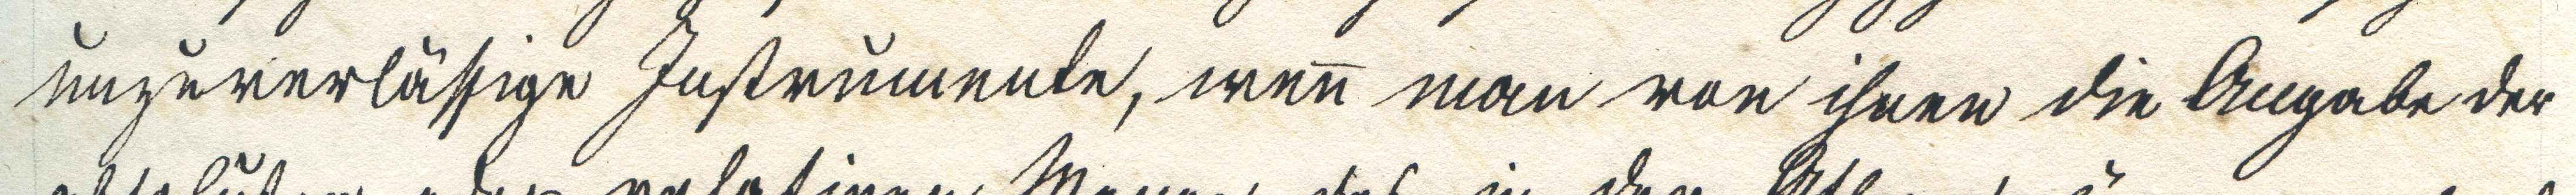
unzuverlässige Instrumente, weñ man von ihnen die Angabe der
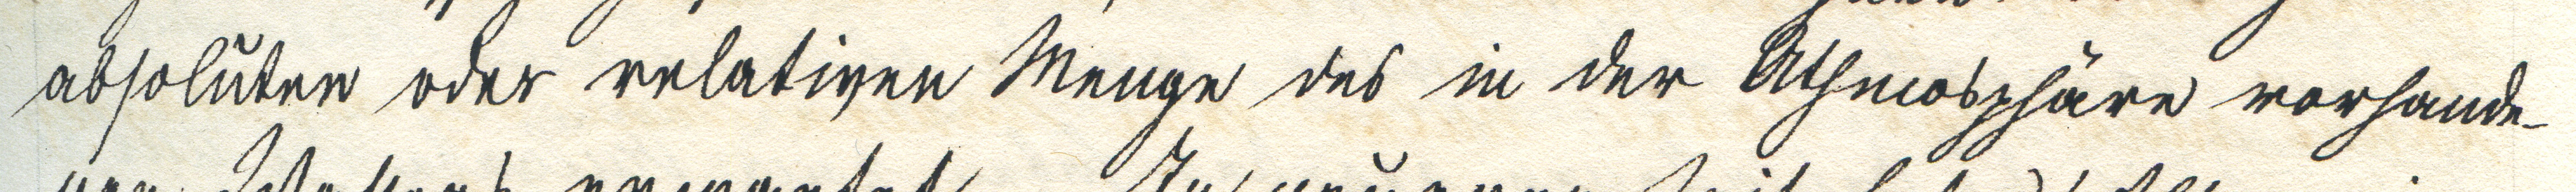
absoluten oder relativen Menge des in der Athmosphäre vorhande-
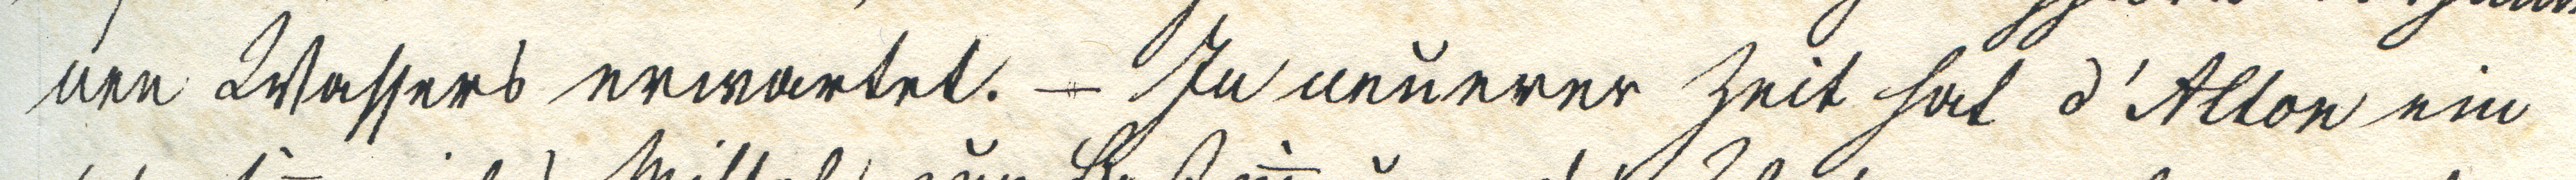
nen Wassers erwartet. – In neuerer Zeit hat d’Alton ein
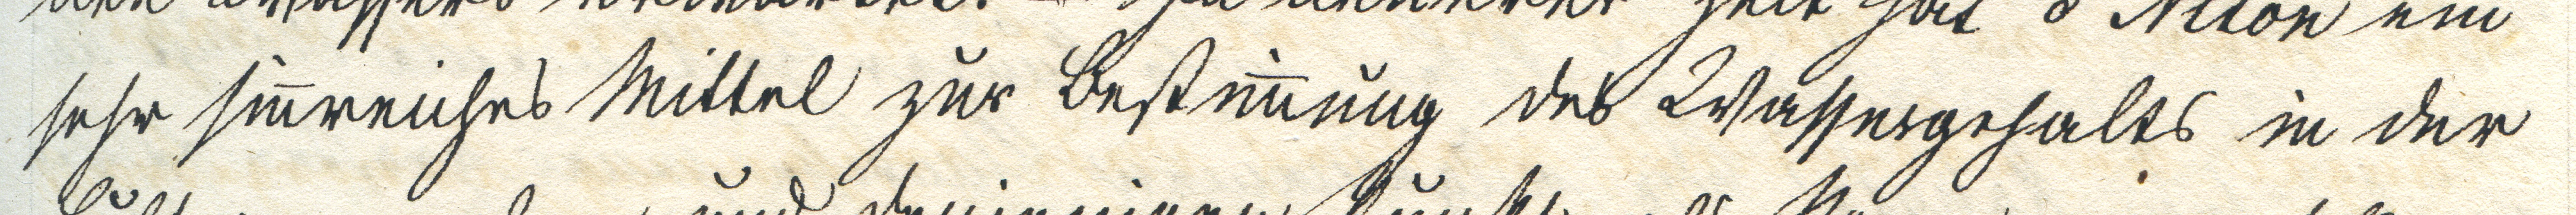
sehr siñreiches Mittel zu Bestim̃ung des Wassergehalts in der
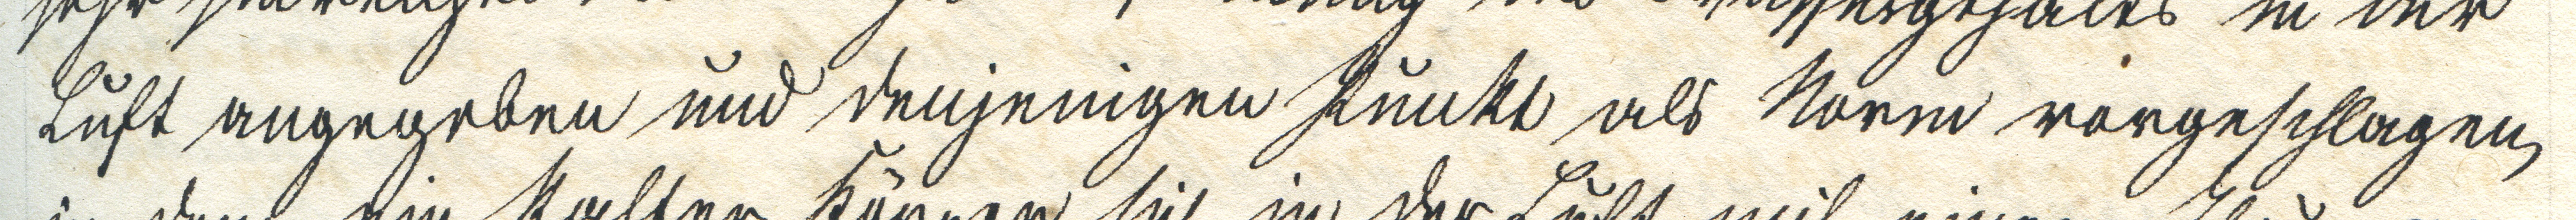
Luft angegeben und denjenigen Punkt als Norm vorgeschlagen,
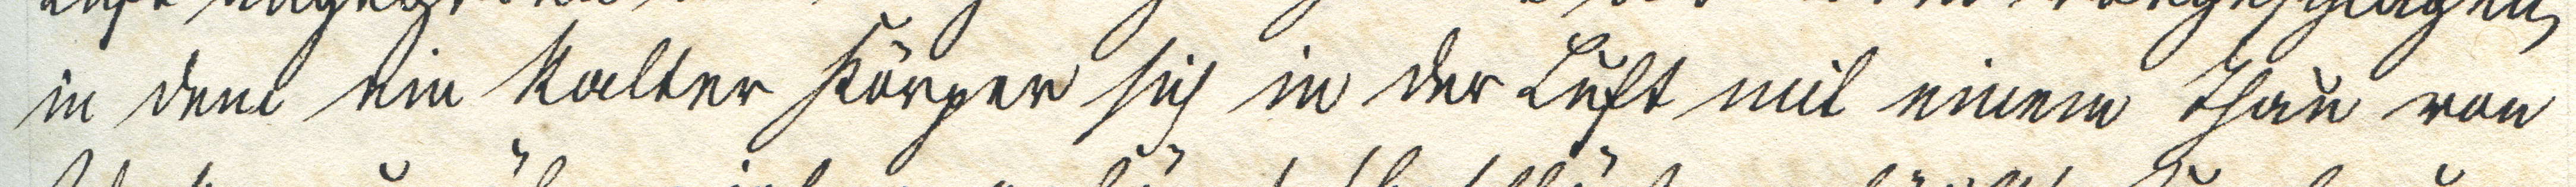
in dem ein kalter Körper sich in der Luft mit einem Thau von
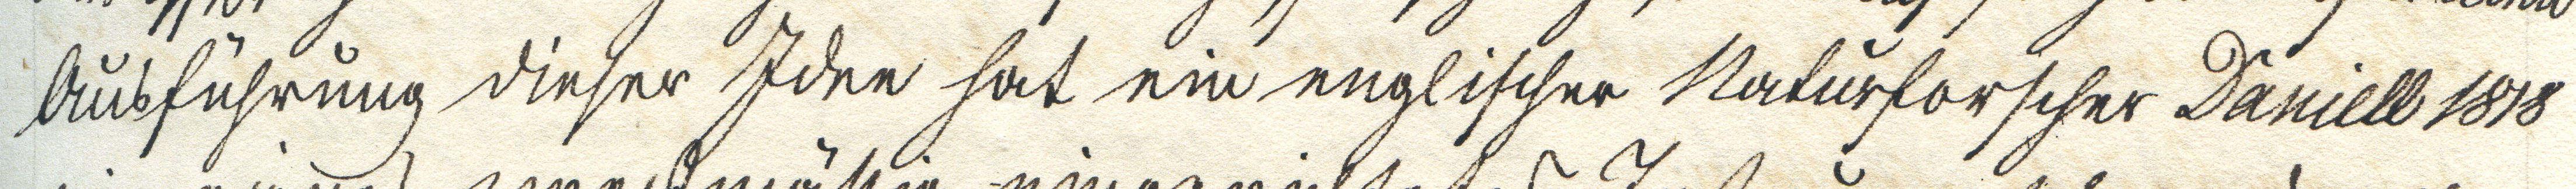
Ausführung dieser Idee hat ein englischer Naturforscher Daniell 1818
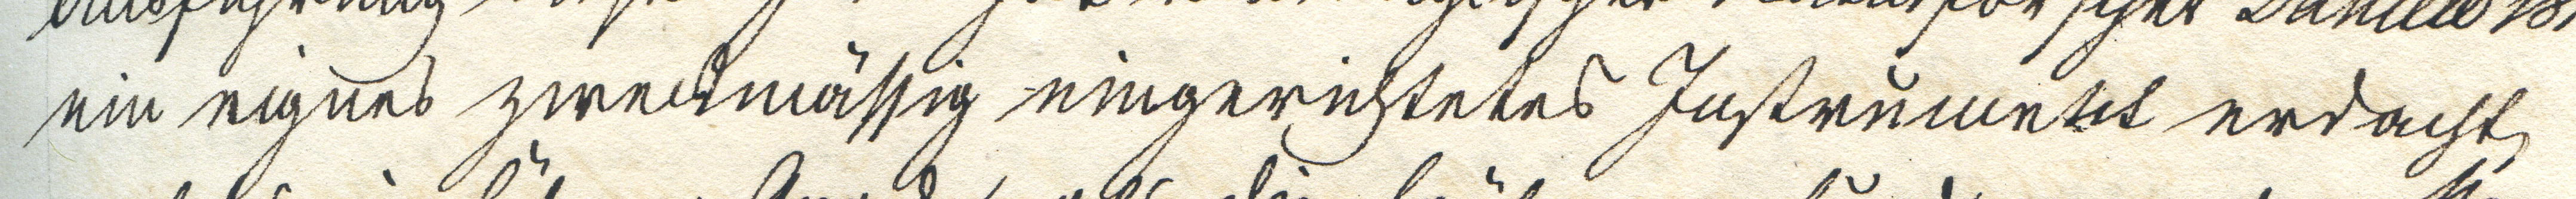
ein eignes zweckmässig eingerichtetes Instrument erdacht,
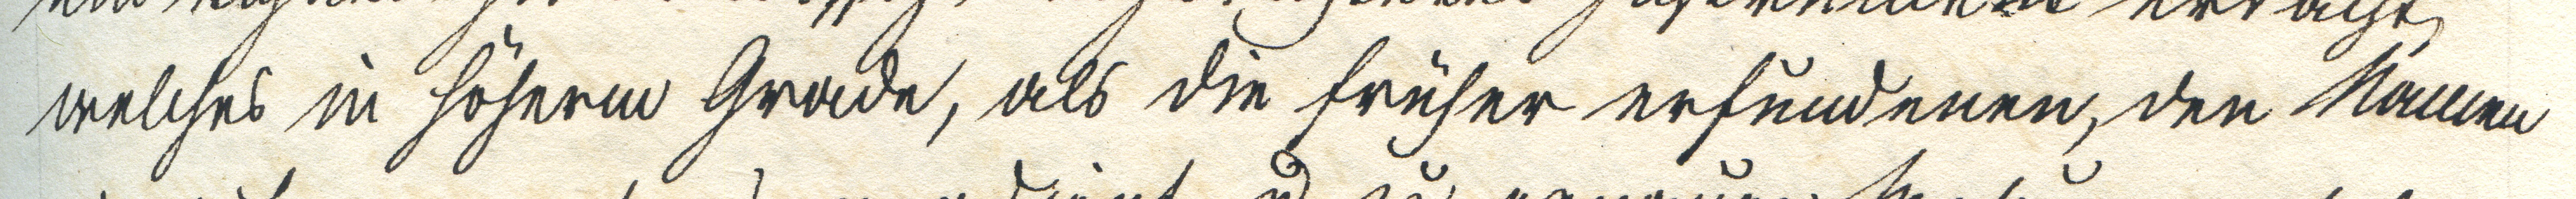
welches in höherm Grade, als die früher erfundenen, den Namen
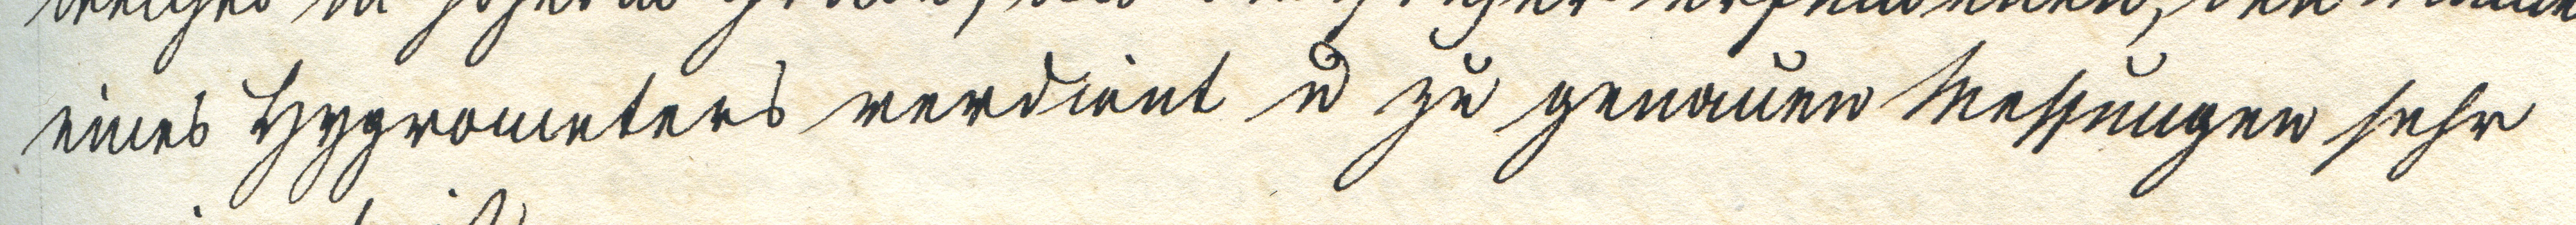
eines Hygrometers verdient u zu genauen Messungen sehr
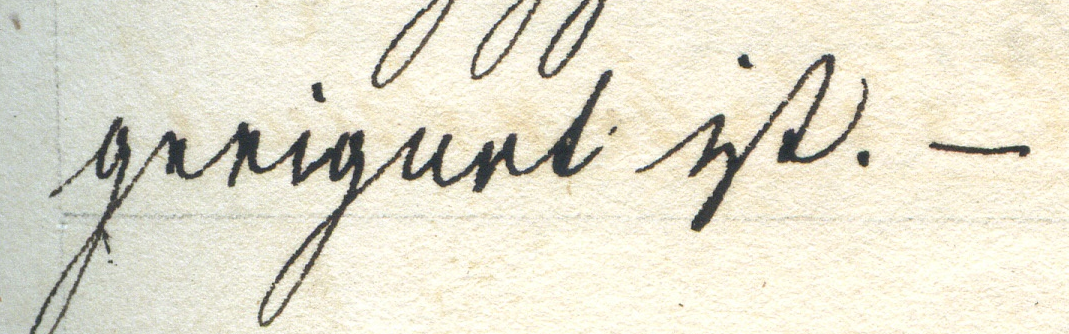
geeignet ist. –
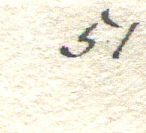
die
